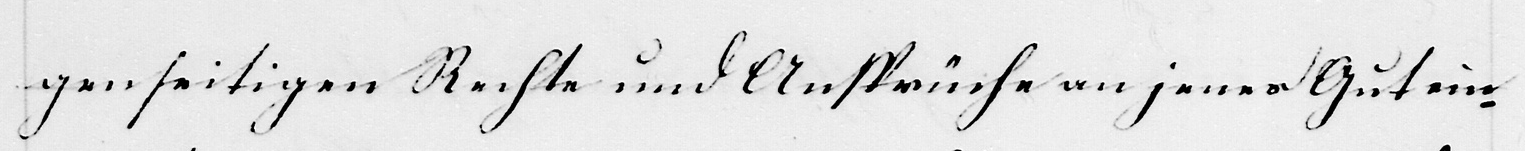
genseitigen Rechte und Ansprüche an jenes Gut ein¬
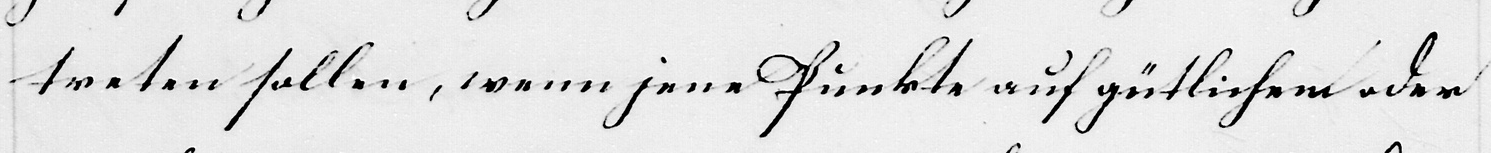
treten sollen, wenn jene Punkte auf gütlichem oder
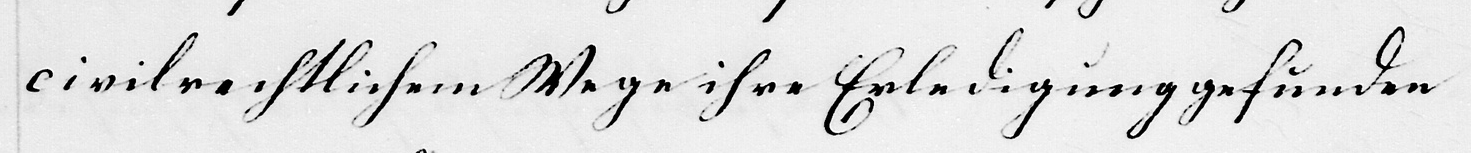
civilrechtlichem Wege ihre Erledigung gefunden
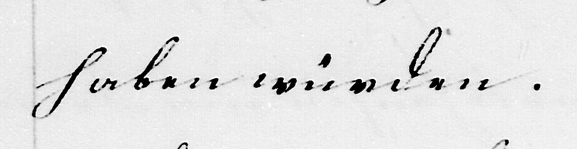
haben würden.
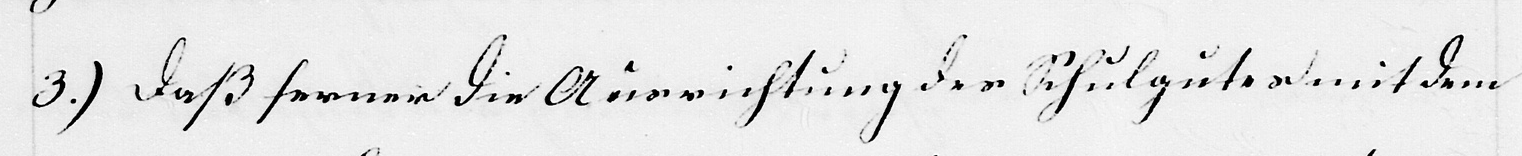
3.) Daß ferner die Ausrichtung des Schulgutes mit dem
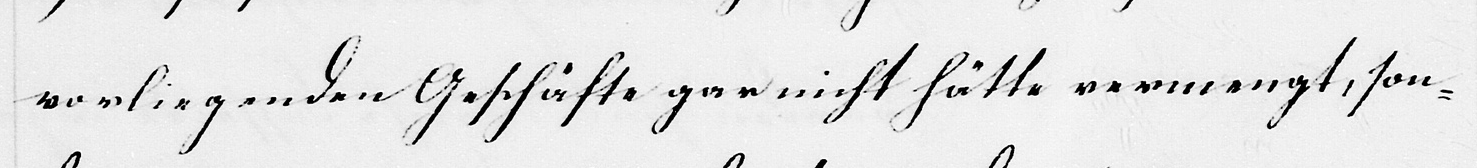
vorliegenden Geschäfte gar nicht hätte vermengt, son¬
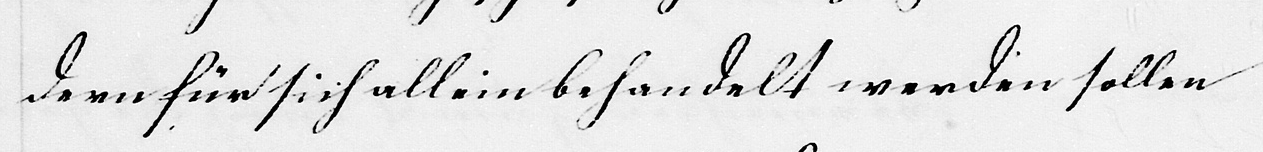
dern für sich allein behandelt werden sollen
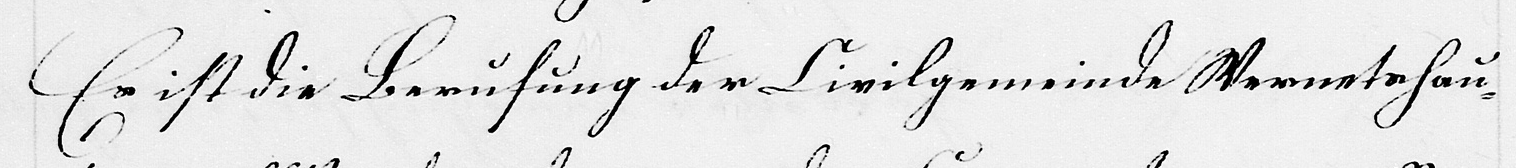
Es ist die Berufung der Civilgemeinde Wernetshau¬
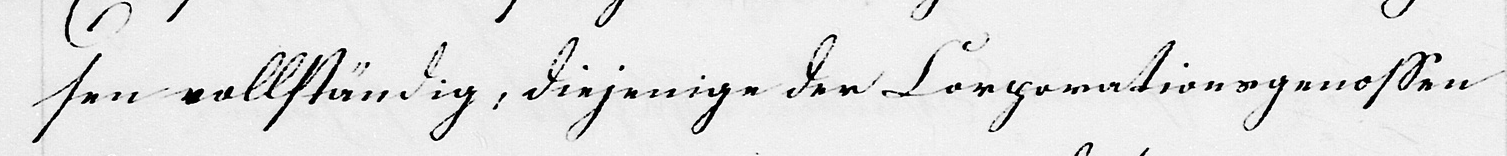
sen vollständig, diejenige der Corporationsgenoßen
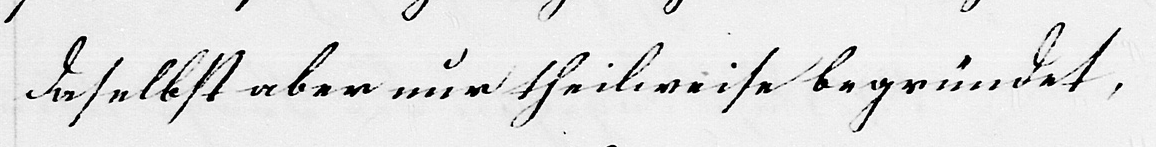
daselbst aber nur theilweise begründet,
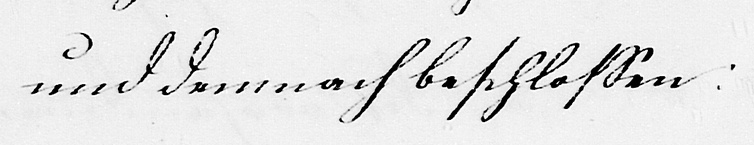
und demnach beschloßen:
